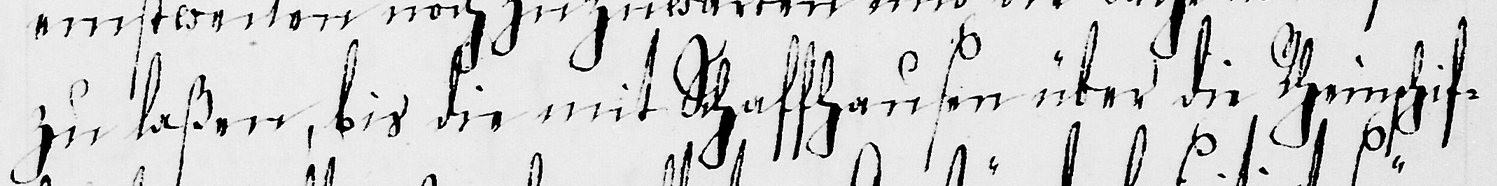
zu laßen, bis die mit Schaffhausen über die Rheinschif¬
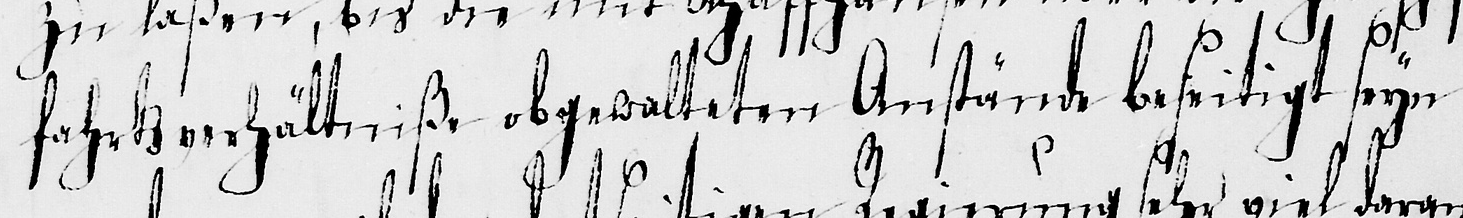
fahrtsverhältniße abgewalteten Anstände beseitigt seyn
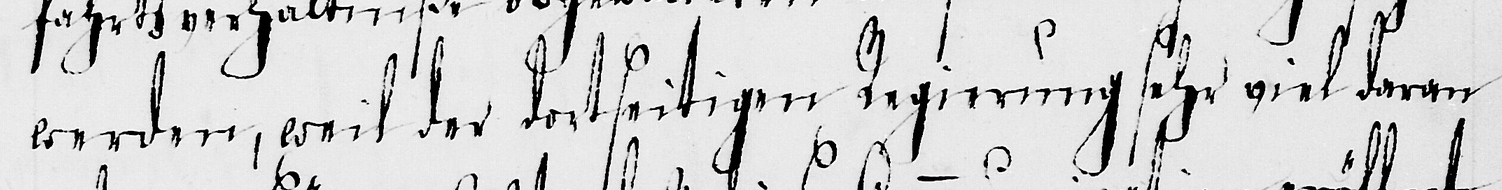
werden, weil der dortseitigen Regierung sehr viel daran
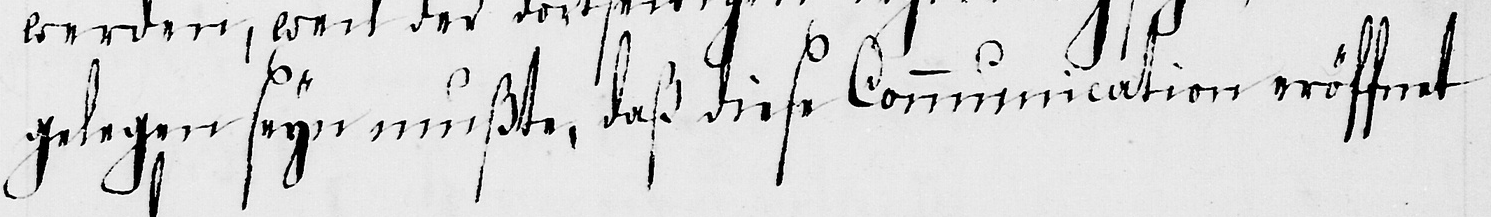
gelegen seyn mußte, daß diese Communication eröffnet
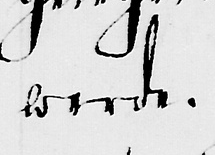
werde.
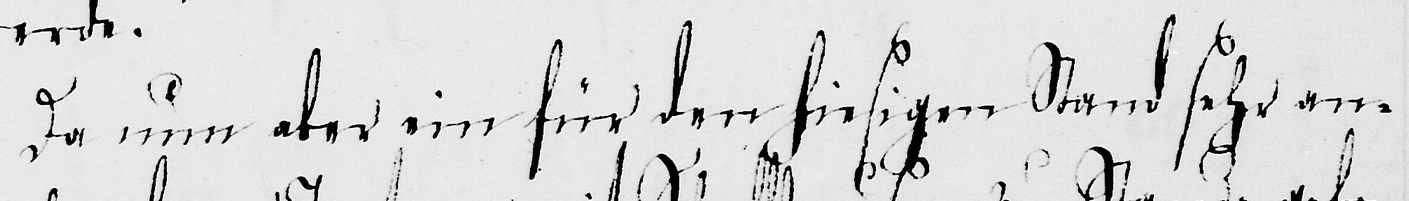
Da nun aber ein für den hiesigen Stand sehr an¬
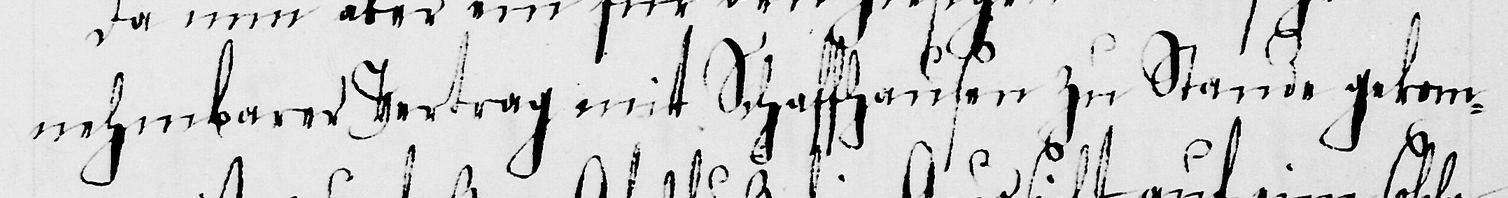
nehmbarer Vertrag mit Schaffhausen zu Stande gekom¬
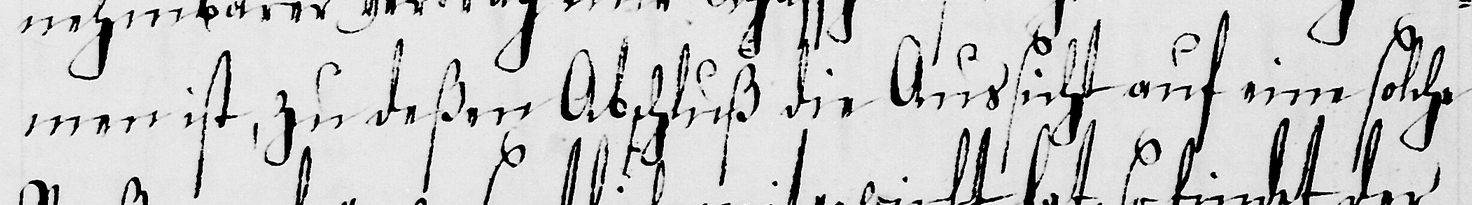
men ist, zu deßen Abschluß die Aussicht auf eine solche
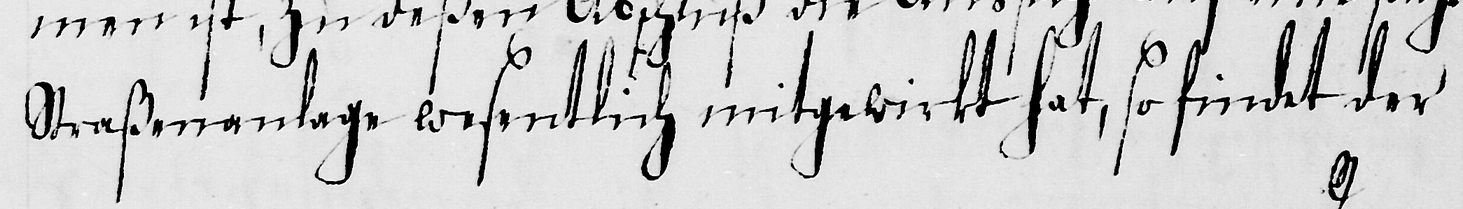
Straßenanlage wesentlich mitgewirkt hat, so findet der
